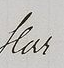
Herr
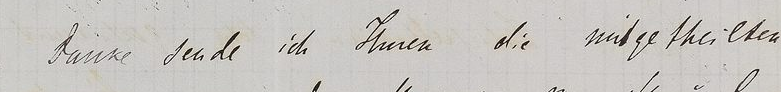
Danke sende ich Ihnen die mitgetheilten
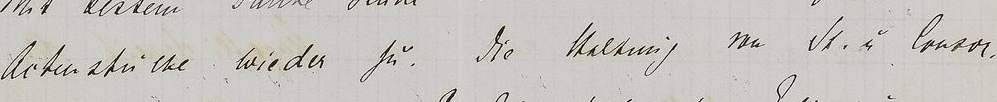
Actenstücke wieder zu. Die Haltung von St. u Consor-
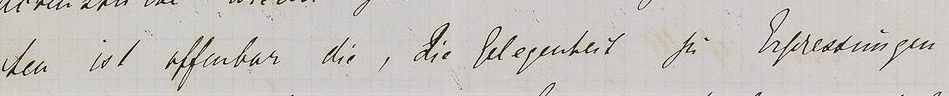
ten ist offenbar die, die Gelegenheit zu Erpressungen
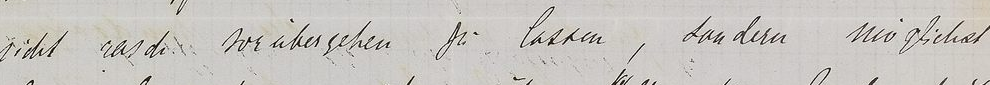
nicht rasch vorübergehen zu lassen, sondern möglichst
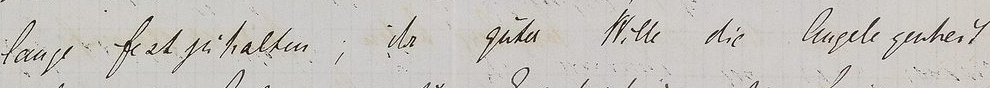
lange festzuhalten; ihr guter Wille die Angelegenheit
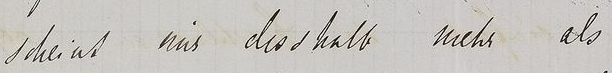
scheint mir desshalb mehr als
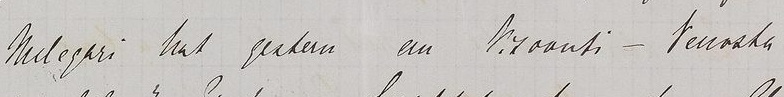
Melegari hat gestern an Visconti-Venosta
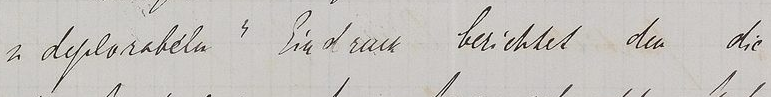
«deplorabeln» Eindruck berichtet den die
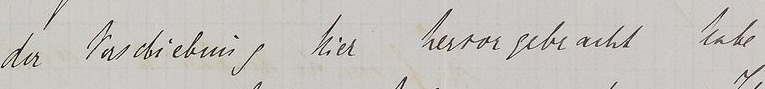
der Verschiebung hier hervorgebracht habe
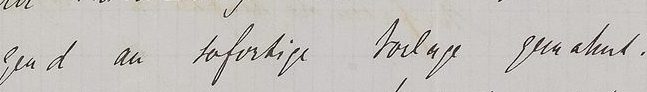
gend an sofortige Vorlage gemahnt.
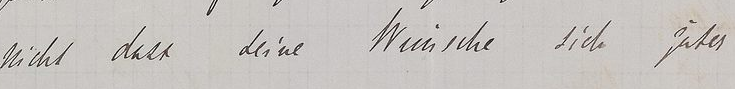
nicht dass seine Wünsche sich guter
